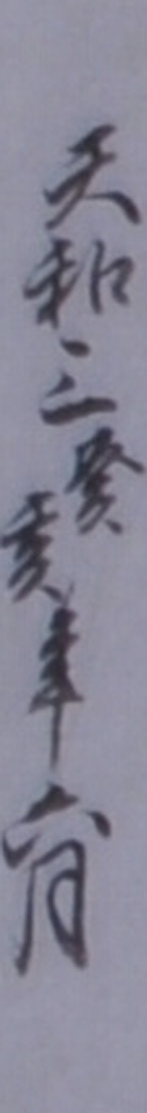天和三癸亥年六月

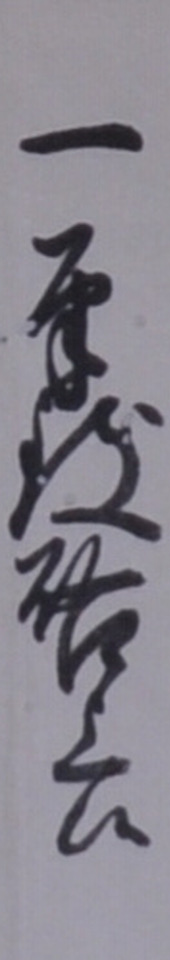一筆致啓上候
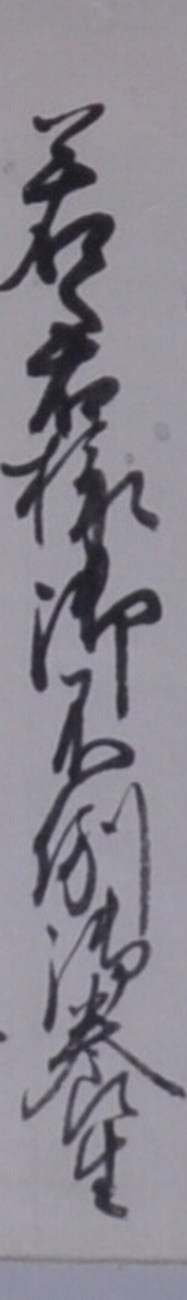若君様御不例御養生
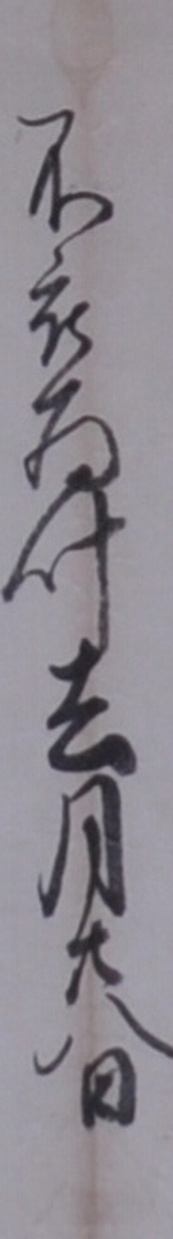不被為叶去月廿八日
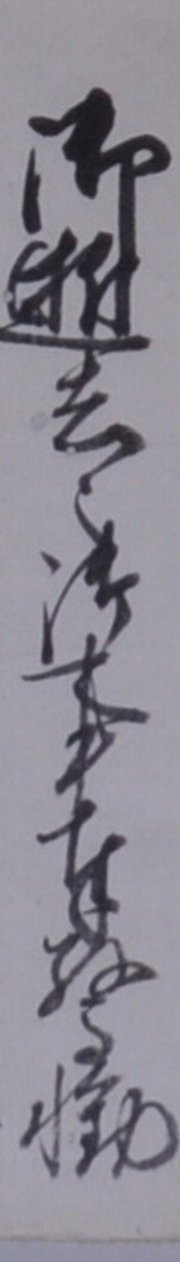御逝去之御事奉驚慟
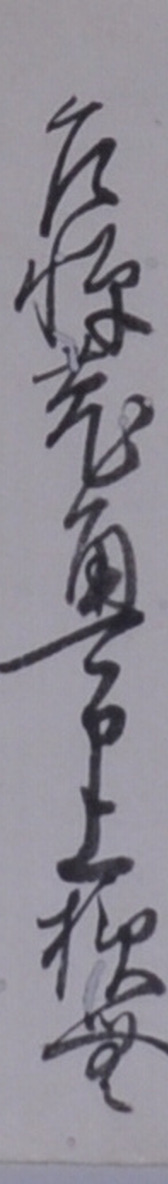乍憚兎角可申上様無
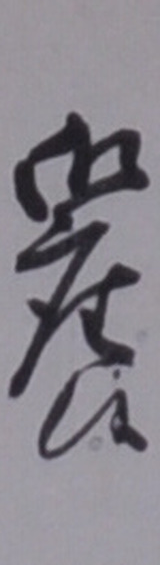御座候
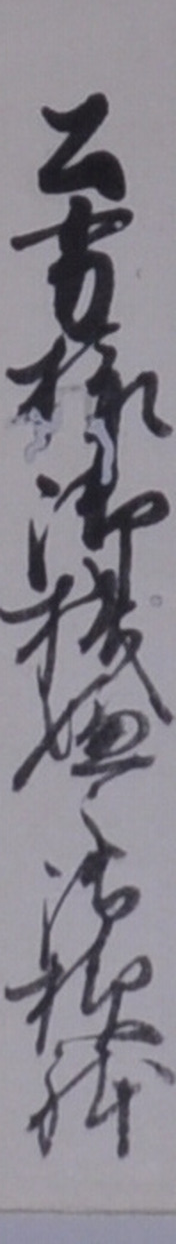公方様御機嫌之御様躰
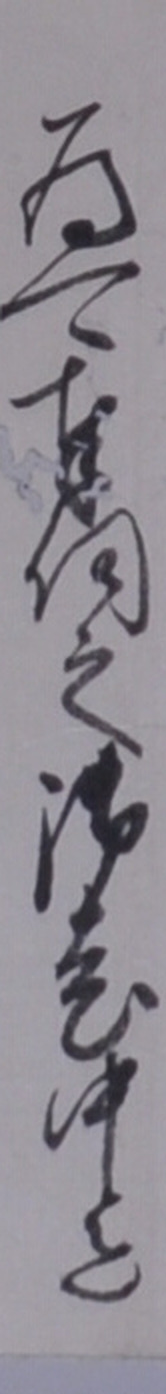為可奉伺之御老中迄
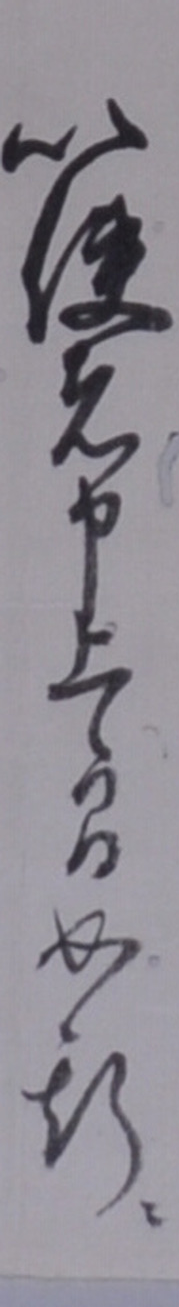以使者申上候間如斯ニ
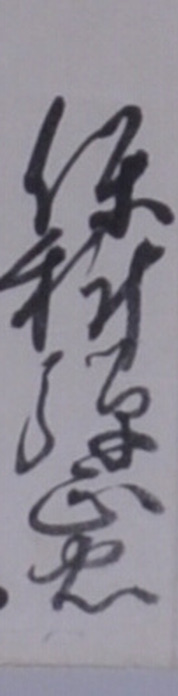保科弾正忠
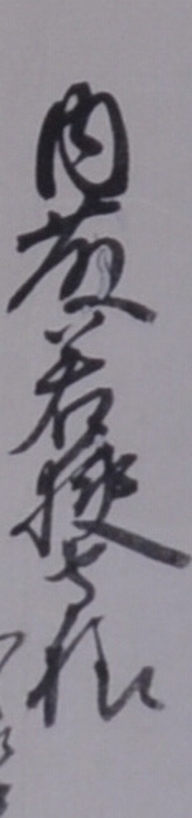内藤若狭守様
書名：書状
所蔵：伊那市立高遠町図書館・合同会社AMANE
